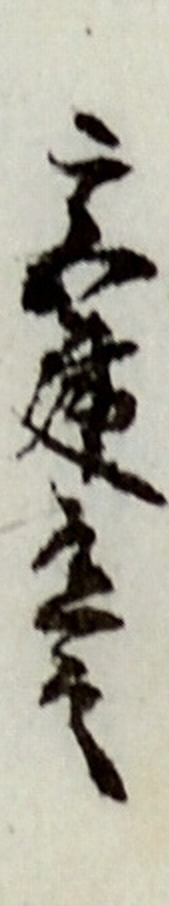宮建有之

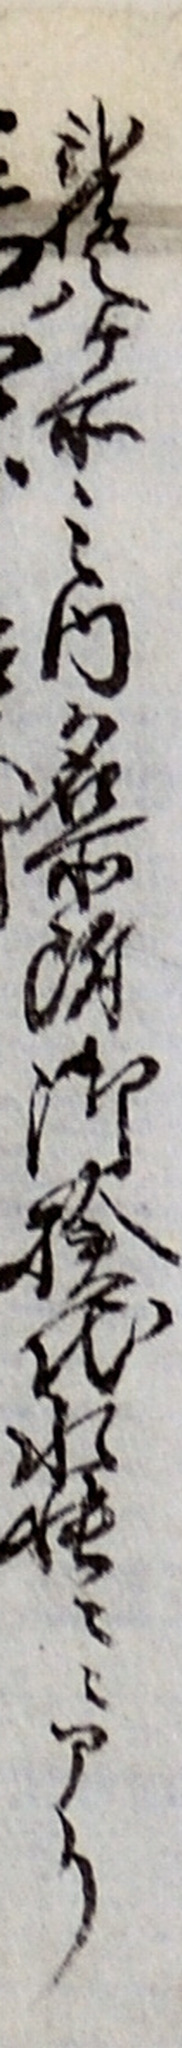弐拾八ヶ所之内名前附御検地水帳ニニアリ
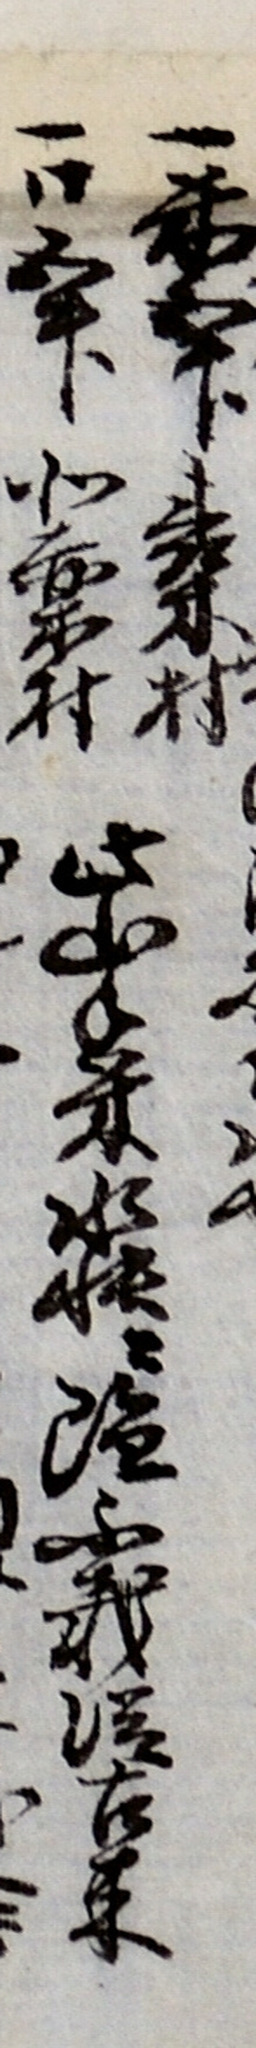一同五升北赤木村此山手米水帳ニ雖不載従古来
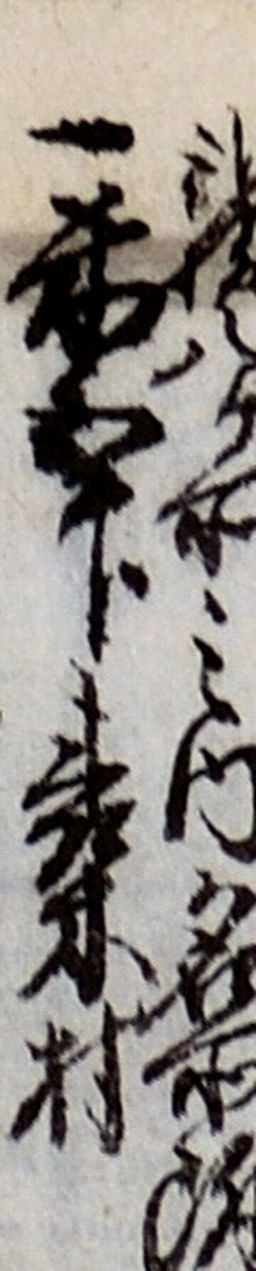一米五升赤木村
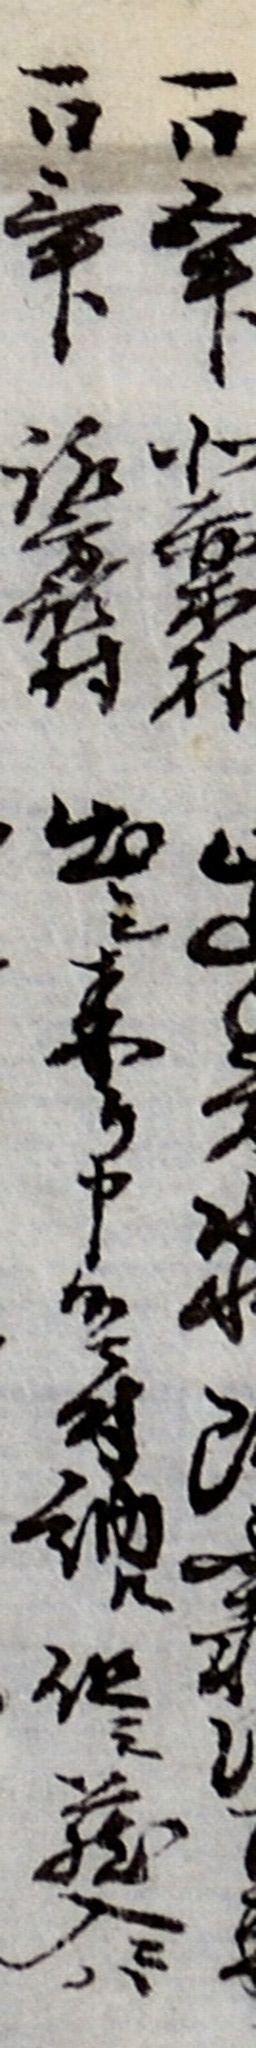一同三升諏訪形村出シ来リ申候ニ付納ル但シ蔵入ニハ
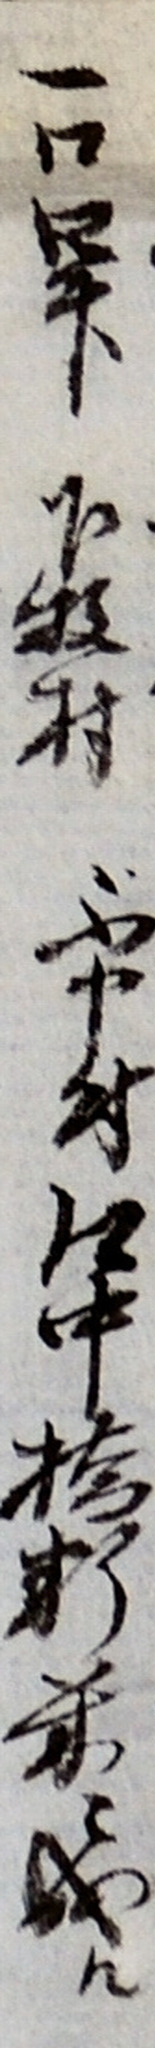一同四升下牧村不申付郷中橋料米ニ成ル

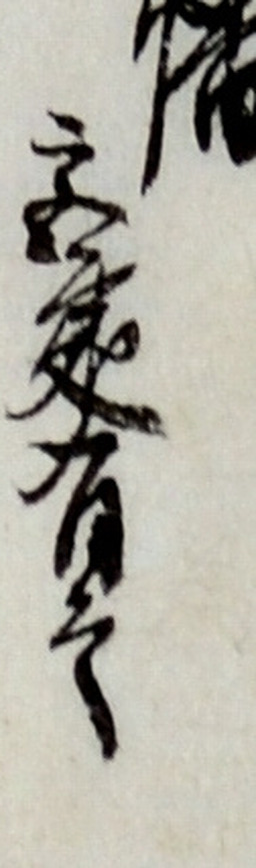宮建有之
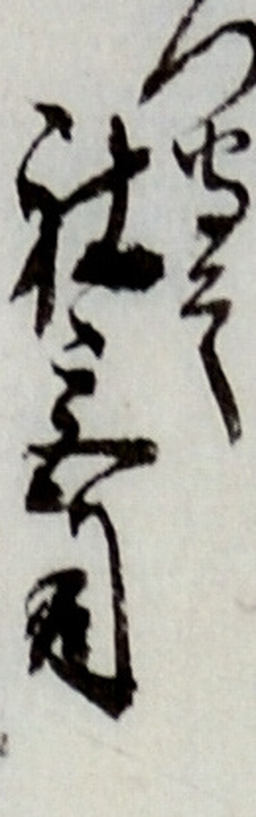社宮司
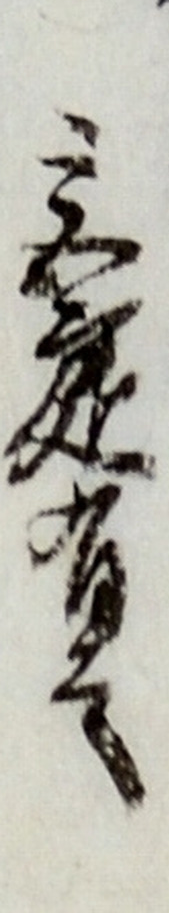宮建有之
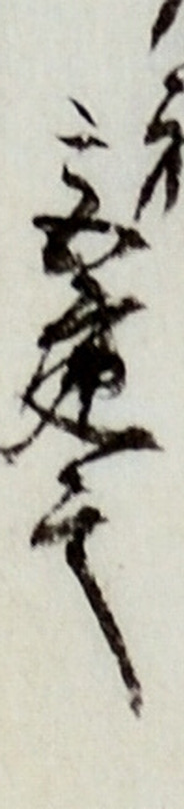宮建之
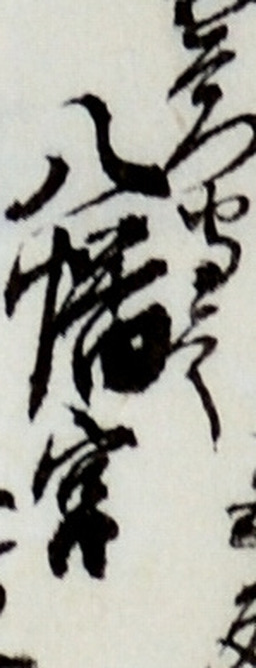八幡宮
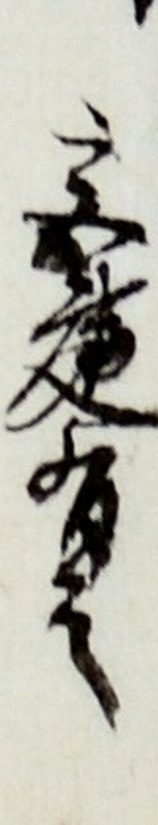宮建有之
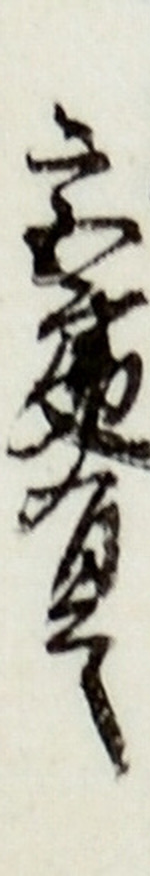宮建有之
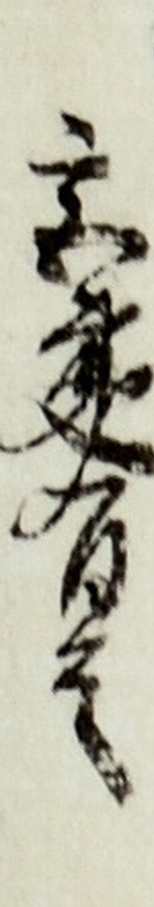宮建有之
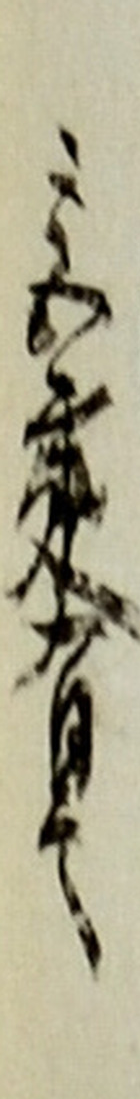宮建有之
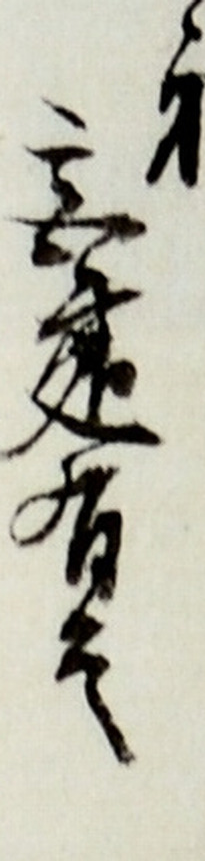宮建有之
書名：御領分中山林社地手控
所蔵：伊那市立高遠町図書館・合同会社AMANE
